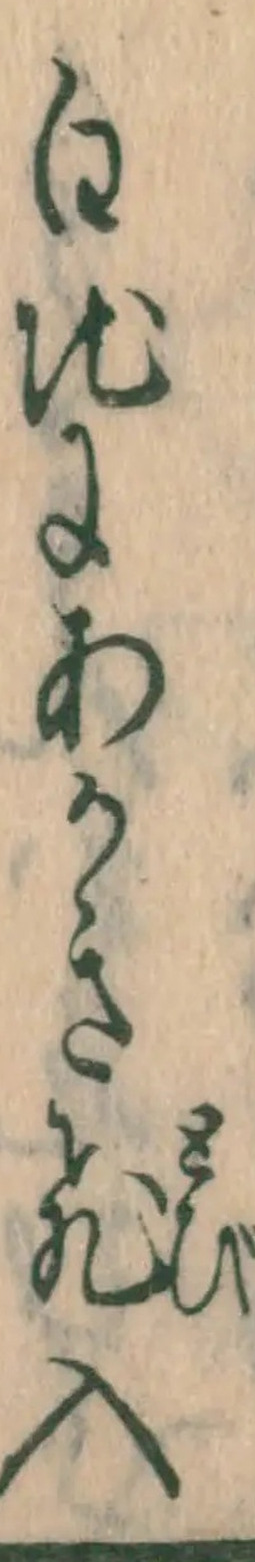白地にあかき飛入
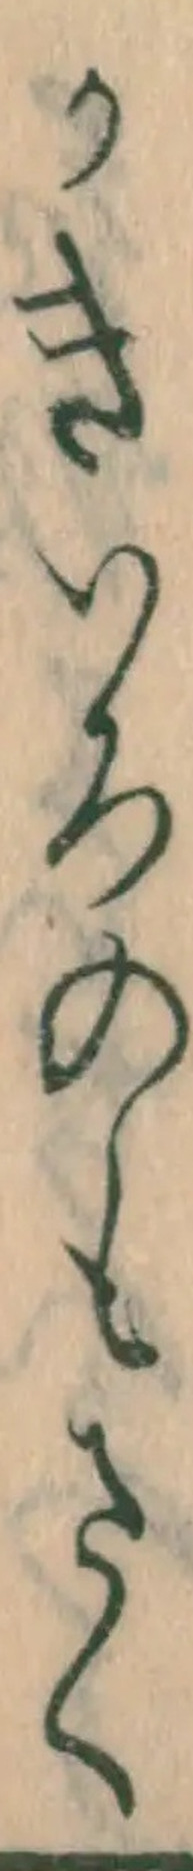かきいろのもさく
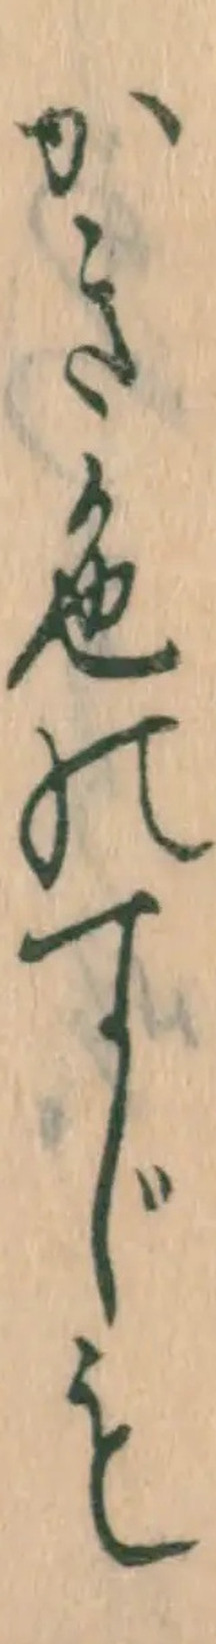かき色のすじも
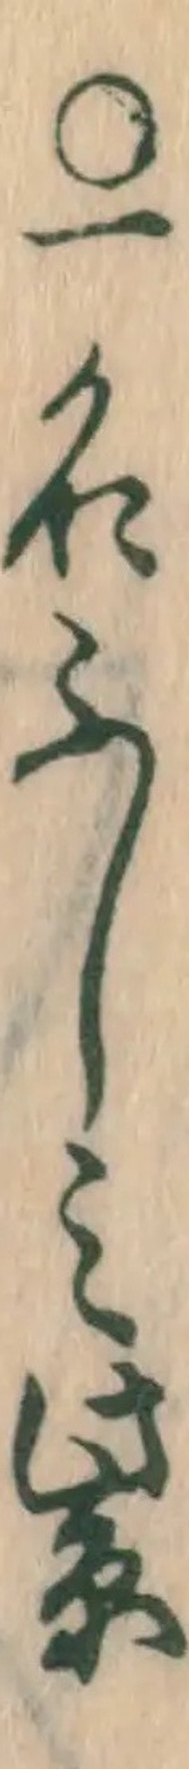○一名ふしみ紫
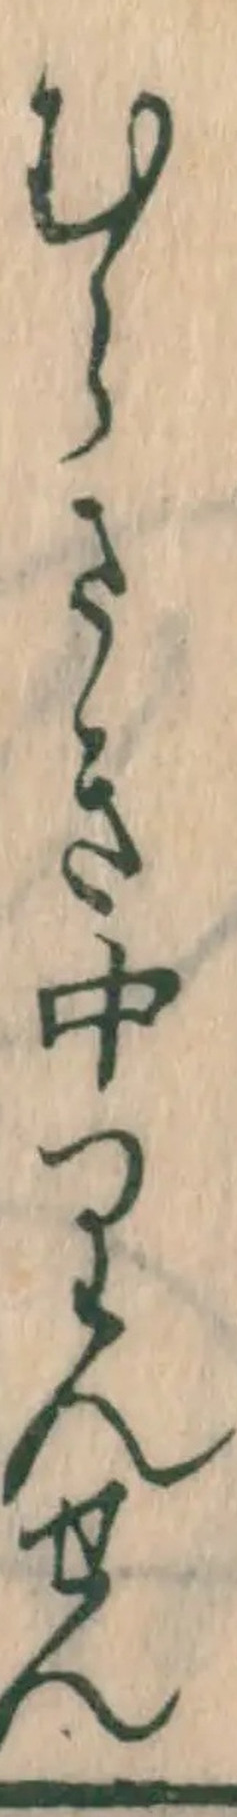むらさき中りんせん
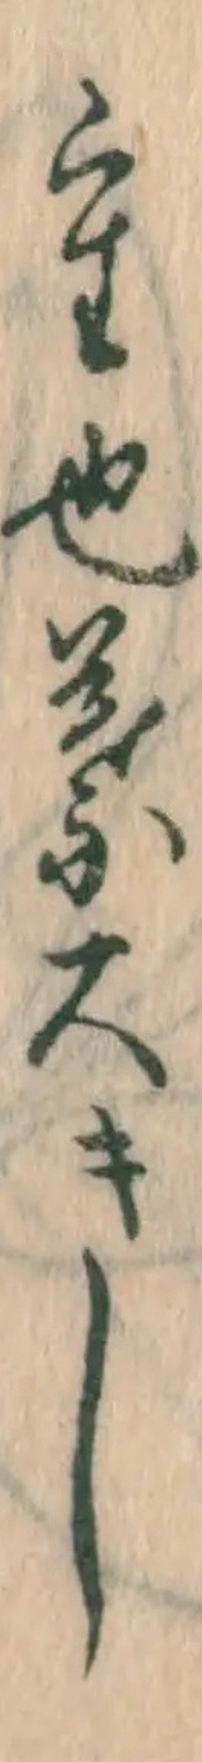重也葉大きし
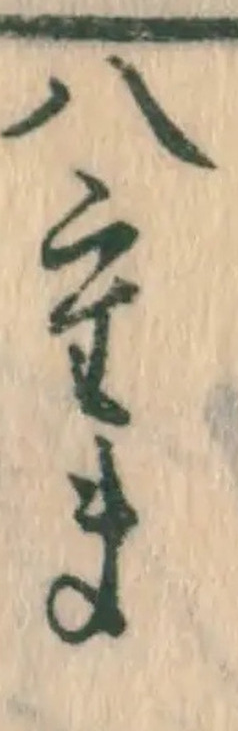八重ま
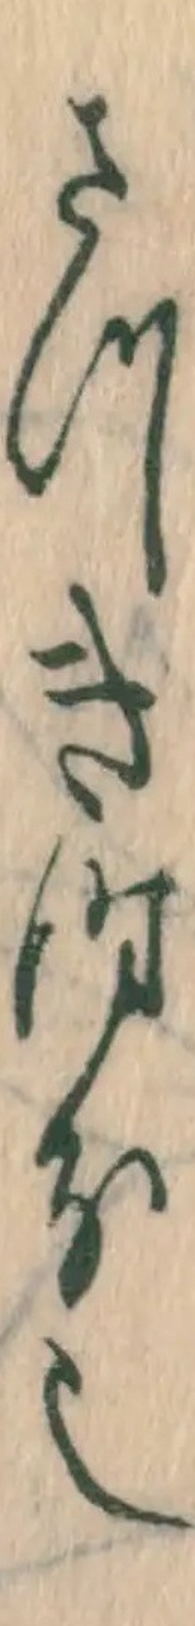さつき時分也
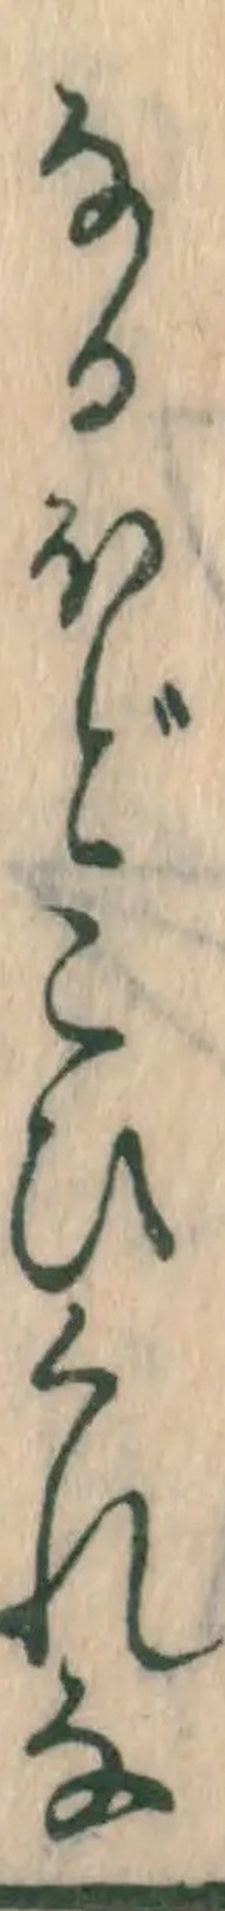なるほどこひくれな
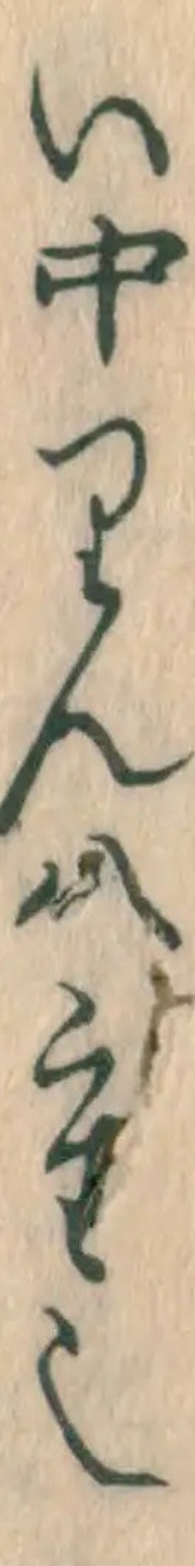い中りん八重也

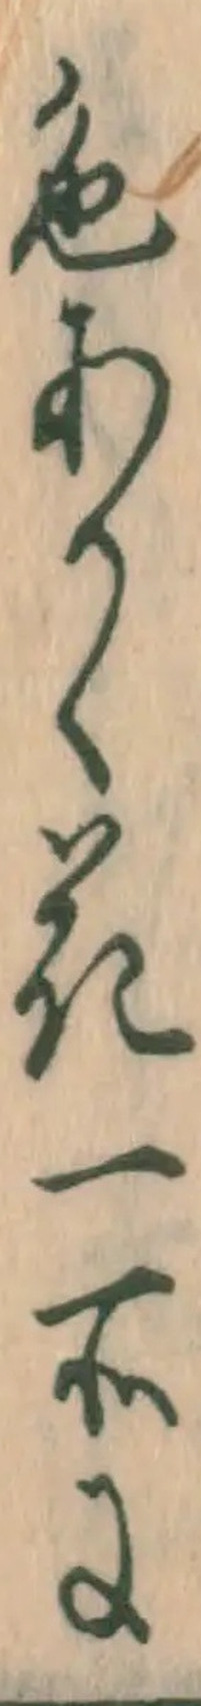色あかく花一所に
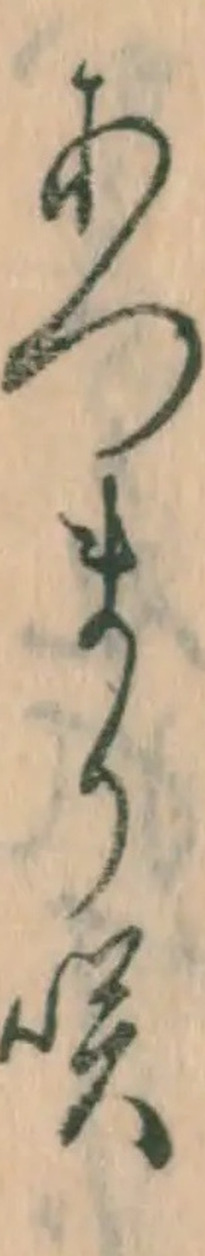あつまり咲
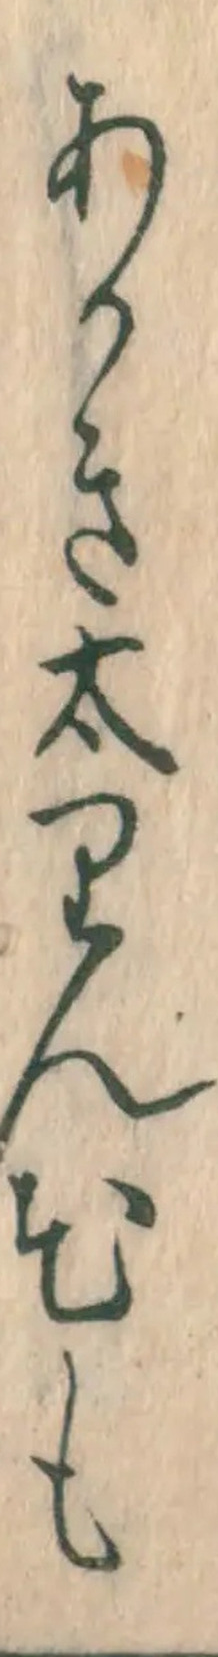あかき太りん花も
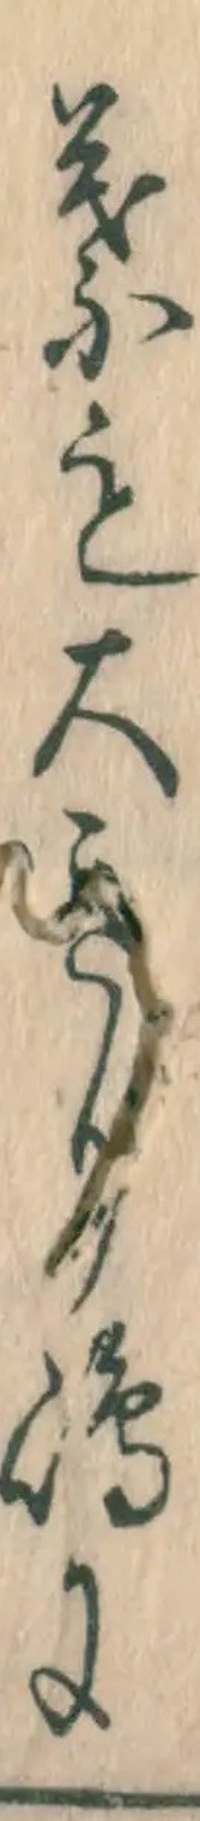葉も大きり嶋に
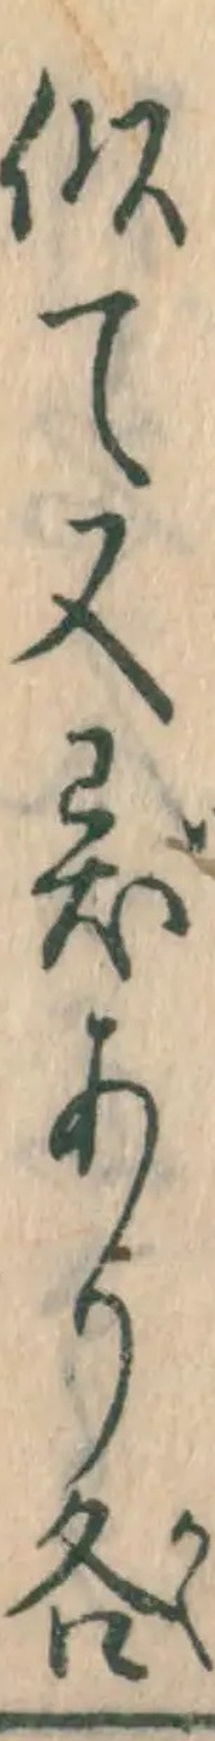似て又異あり各

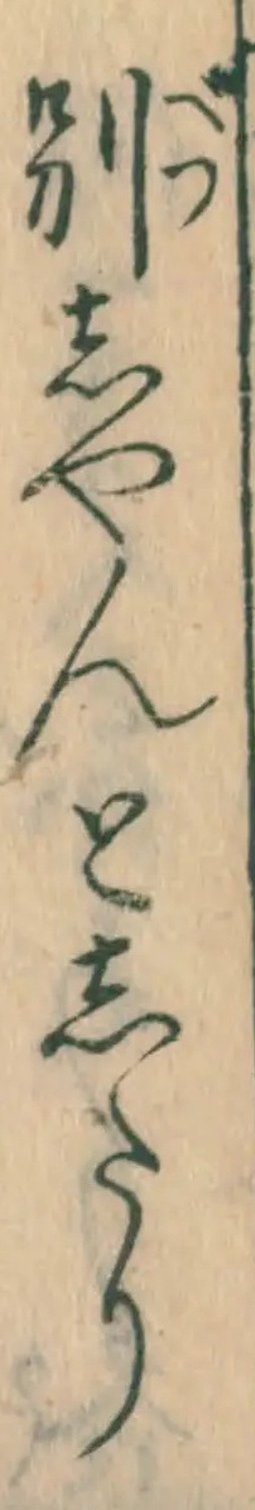別しやんとしたり
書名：錦繍枕 5巻. [3]
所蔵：国立国会図書館 National Diet Library, JAPAN
